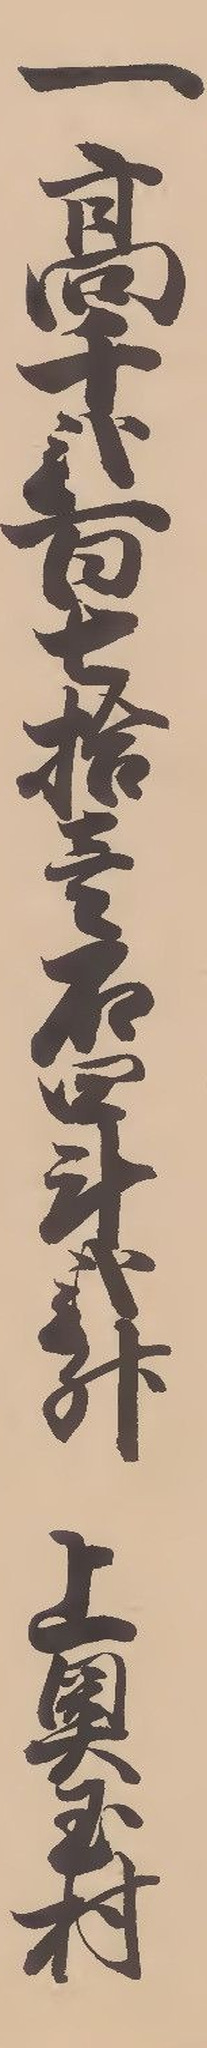一高千弐百七拾壱石四斗弐升上奥玉村
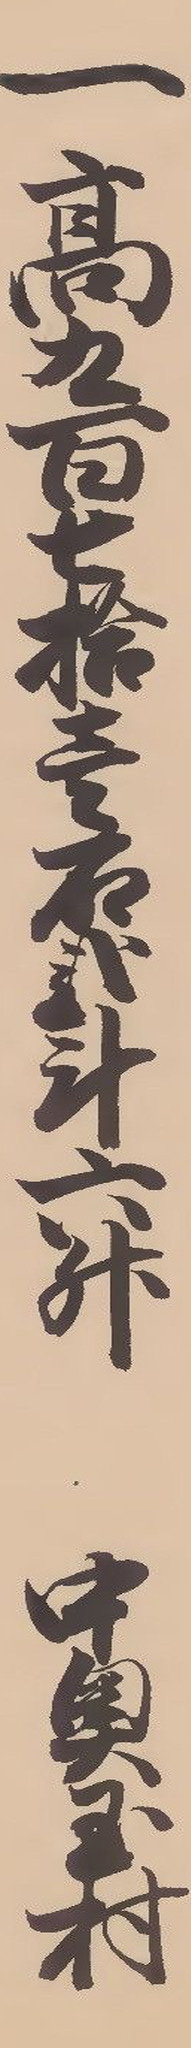一高九百七拾壱石弐斗六升中奥玉村
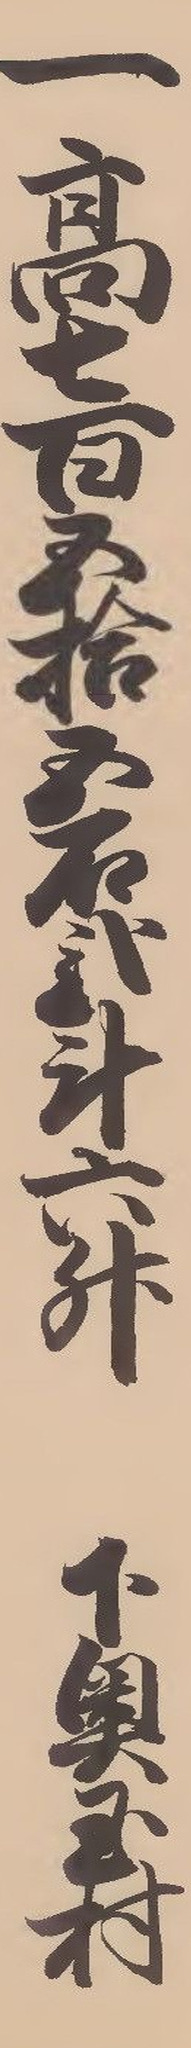一高七百五拾五石弐斗六升下奥玉村
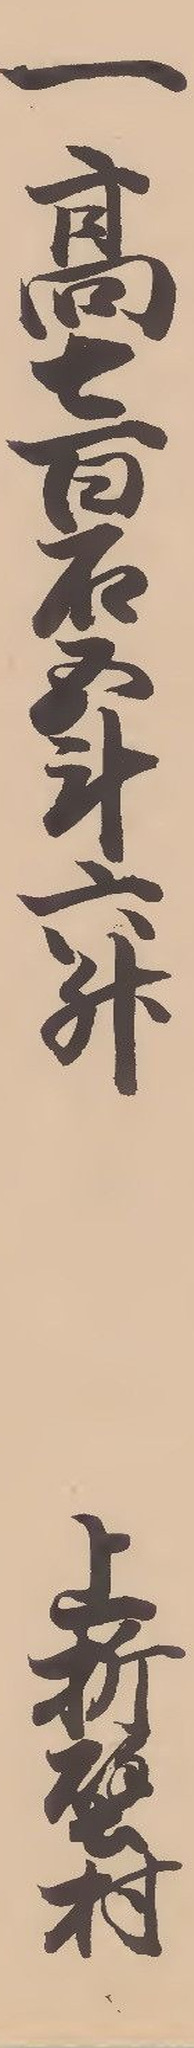一高七百石五斗六升上折壁村
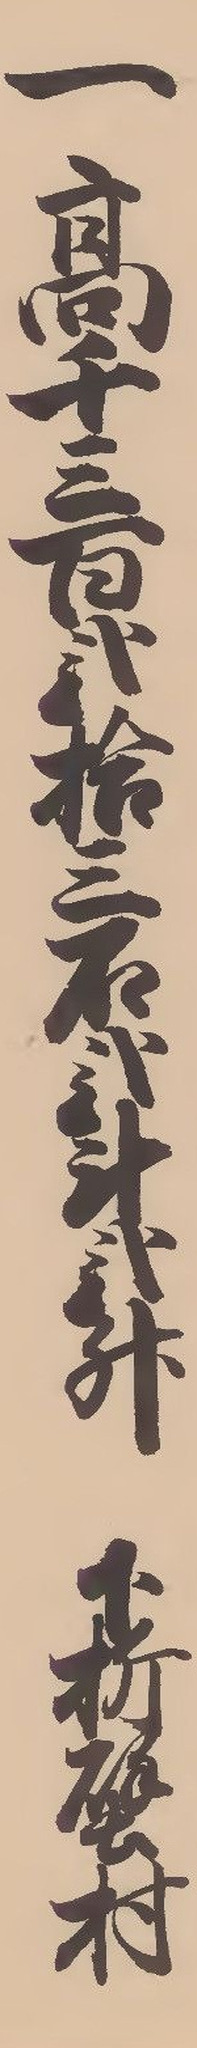一高千三百弐拾三石弐斗弐升下折壁村

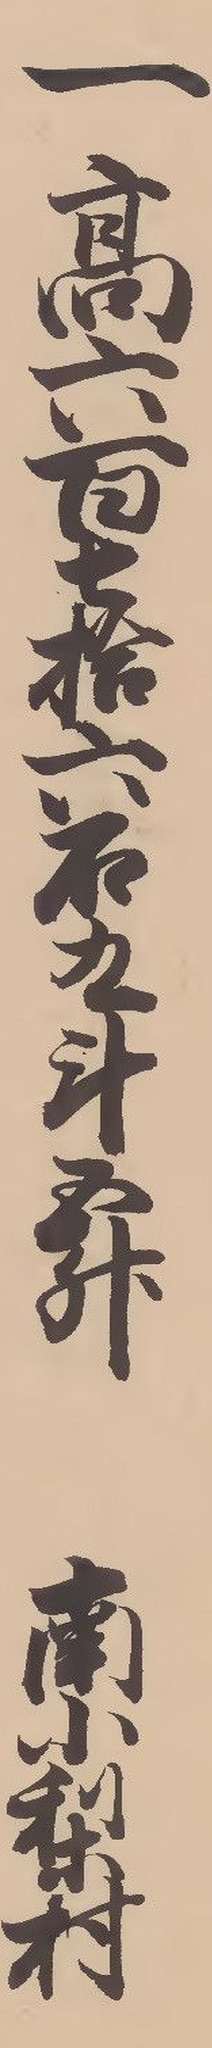一高六百七拾六石九斗五升南小梨村
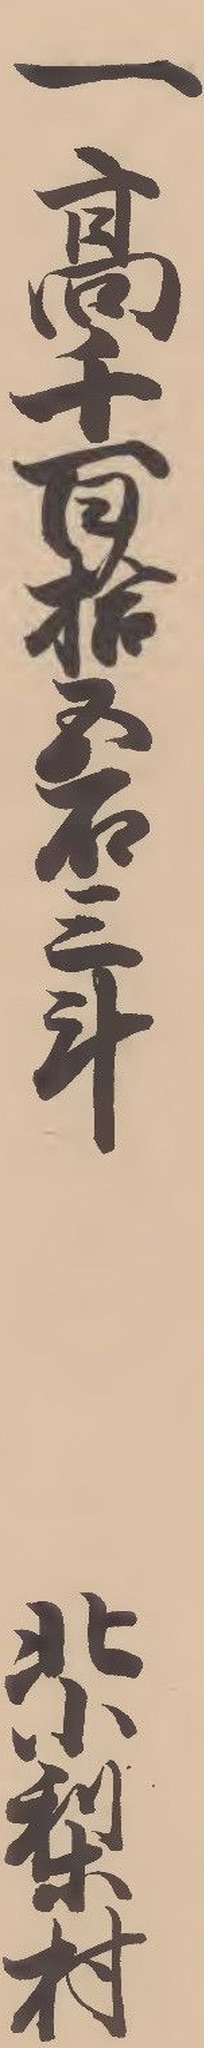一高千百拾五石三斗北小梨村
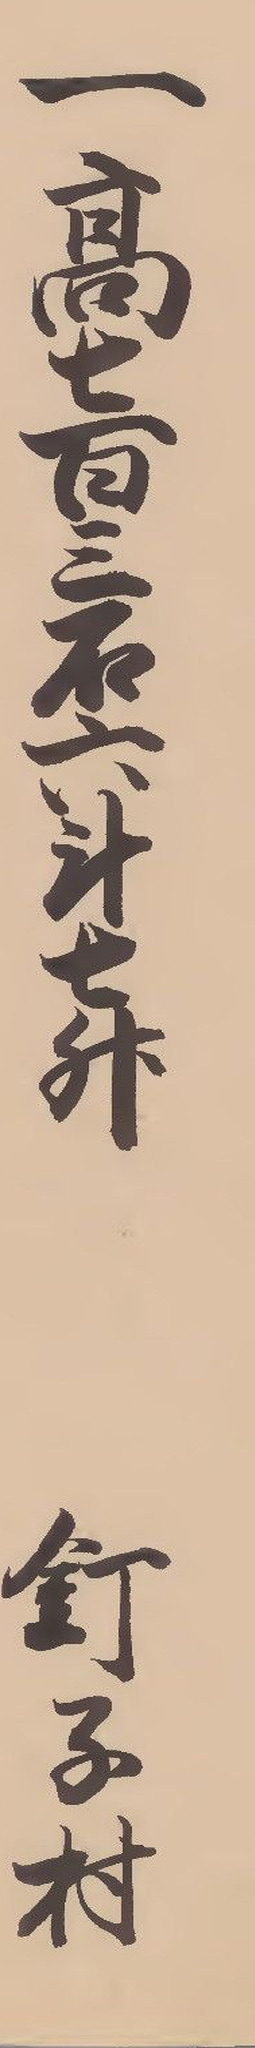一高七百三石六斗七升釘子村
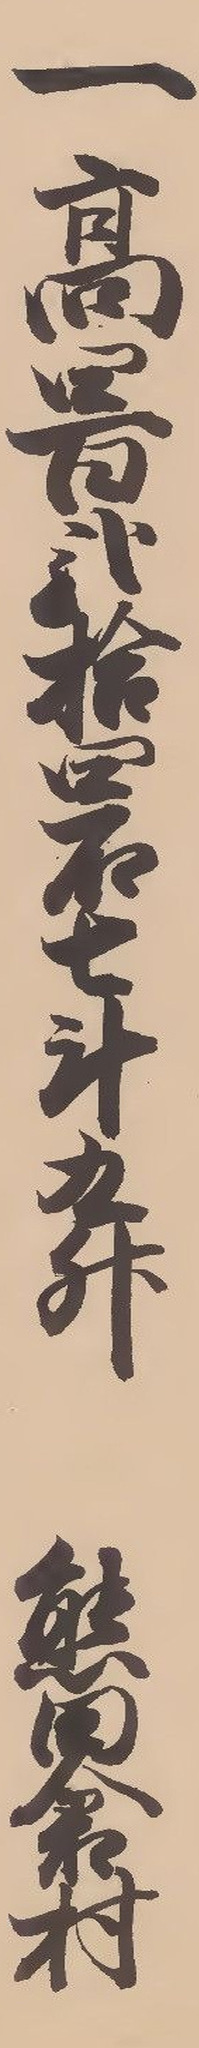一高四百弐拾四石七斗九升熊田倉村
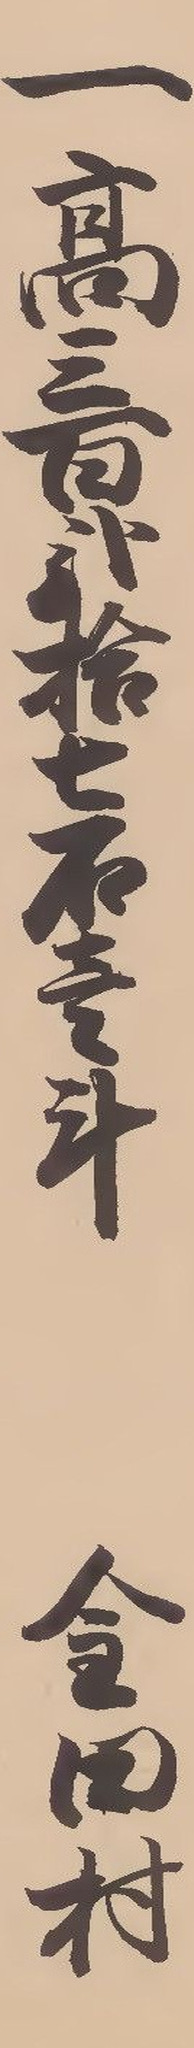一高三百弐拾七石壱斗金田村
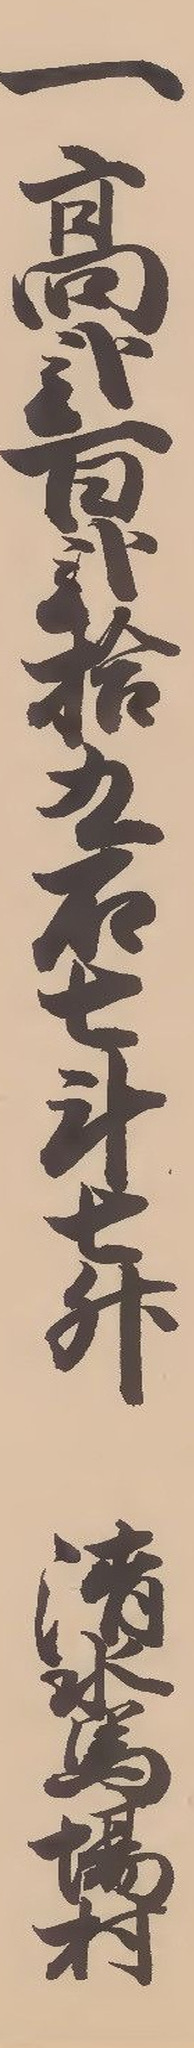一高弐百弐拾九石七斗七升清水馬場村
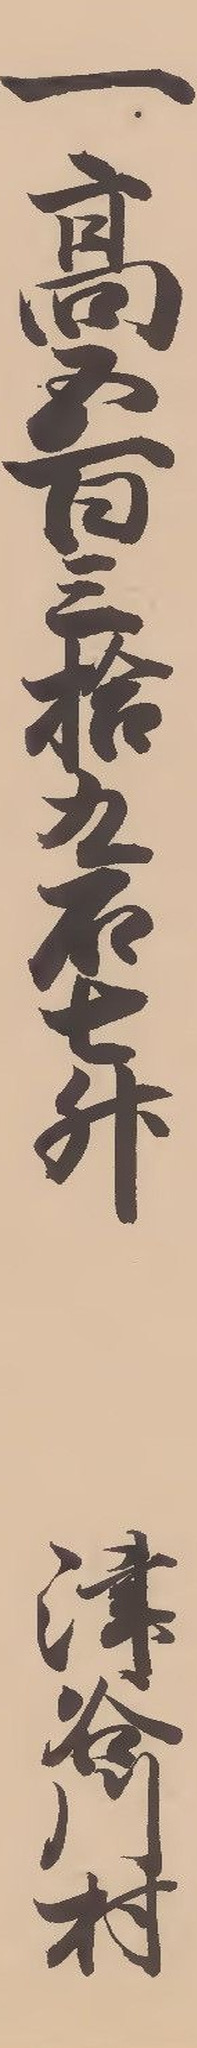一高五百三拾九石七升津谷川村
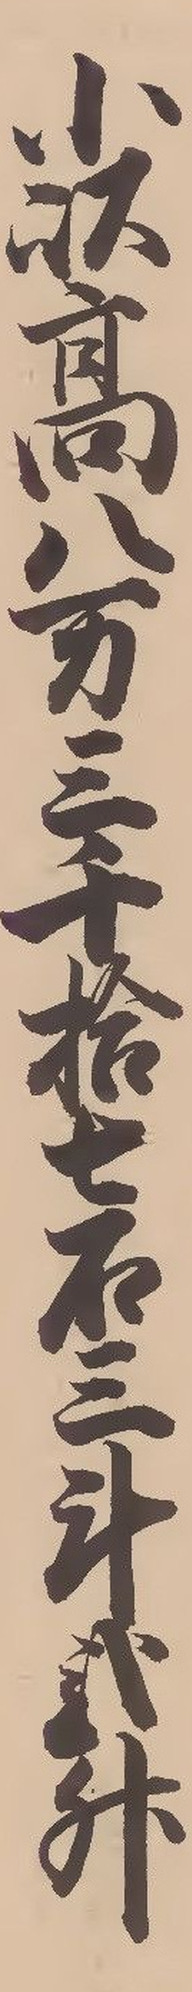小以高八万三千拾七石三斗弐升

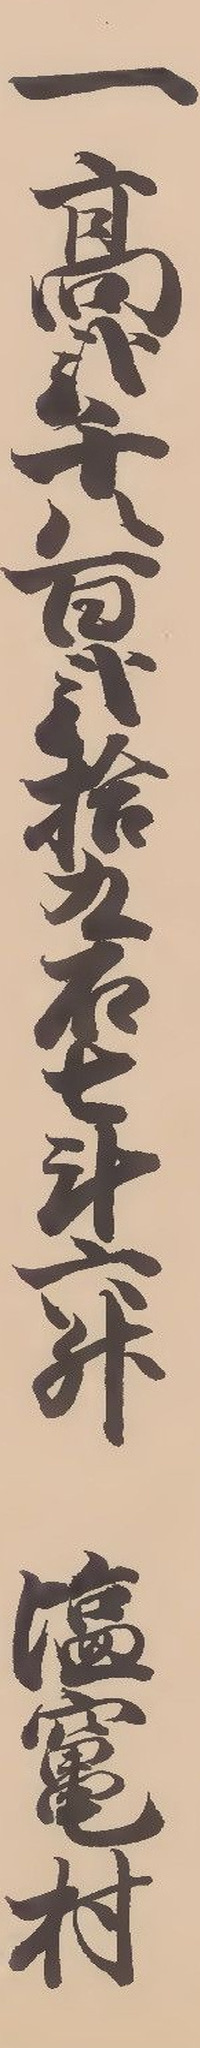一高弐千八百弐拾九石七斗六升塩竃村
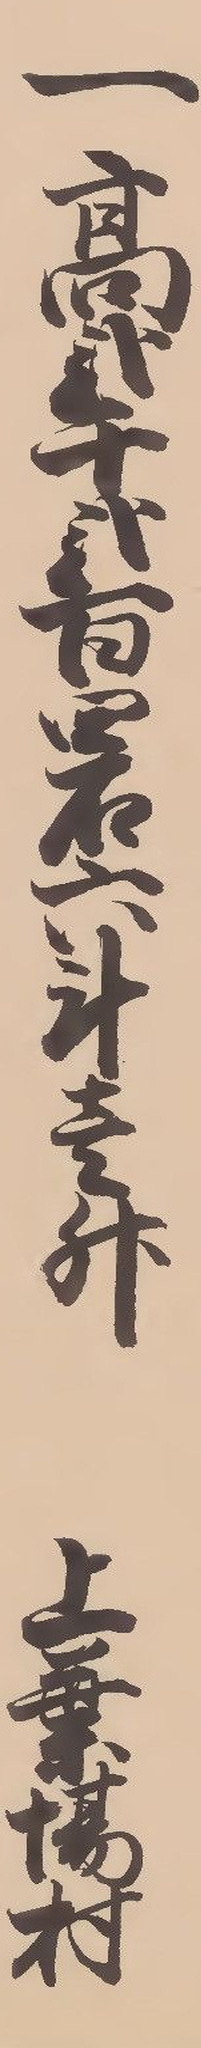一高弐千弐百四石六斗壱升上葉場村
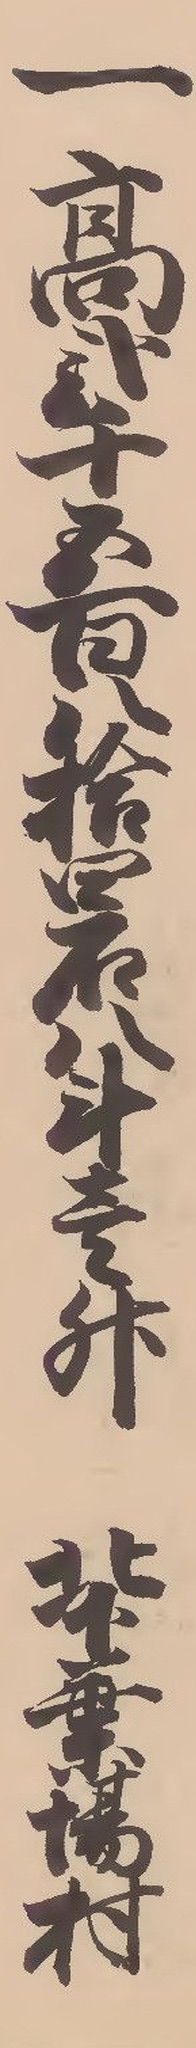一高弐千五百八拾四石八斗壱升北下葉場村
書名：陸奥国郷帳　５
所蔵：国立公文書館 National Archives of Japan
